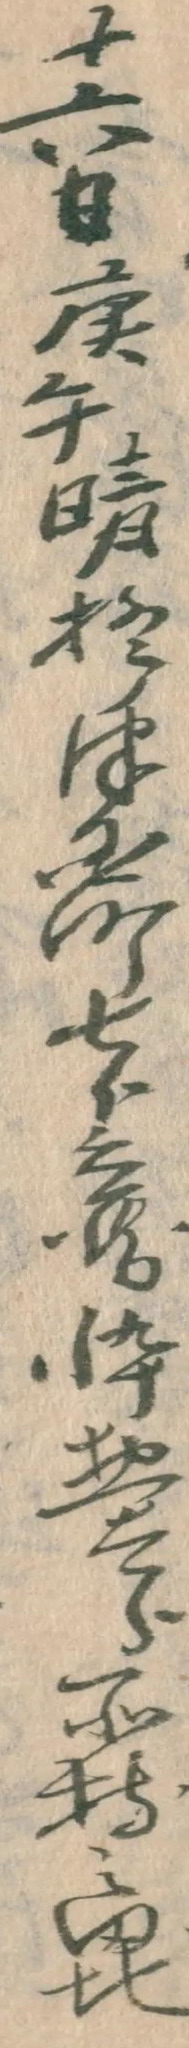十六日庚午晴柊ノ津国町七郎兵衛忰惣太郎所持之田地
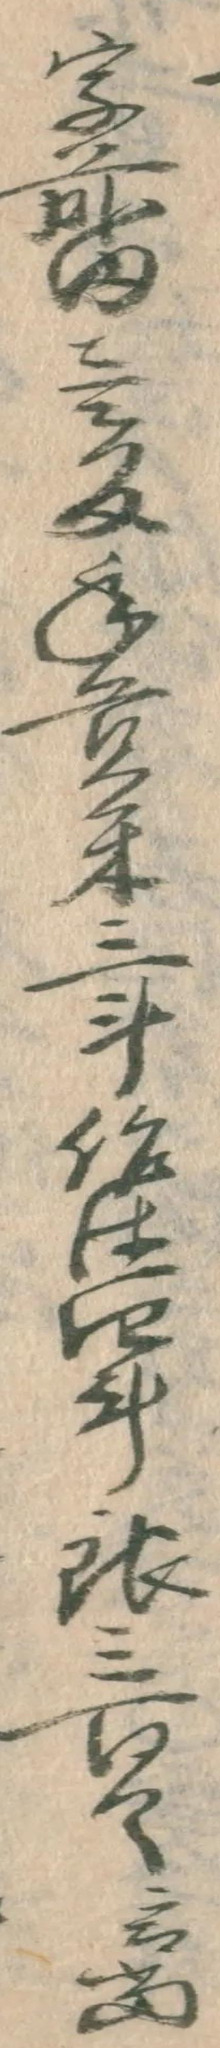字前田壱両年貢米三斗作徳四斗銀三百匁ニ而當
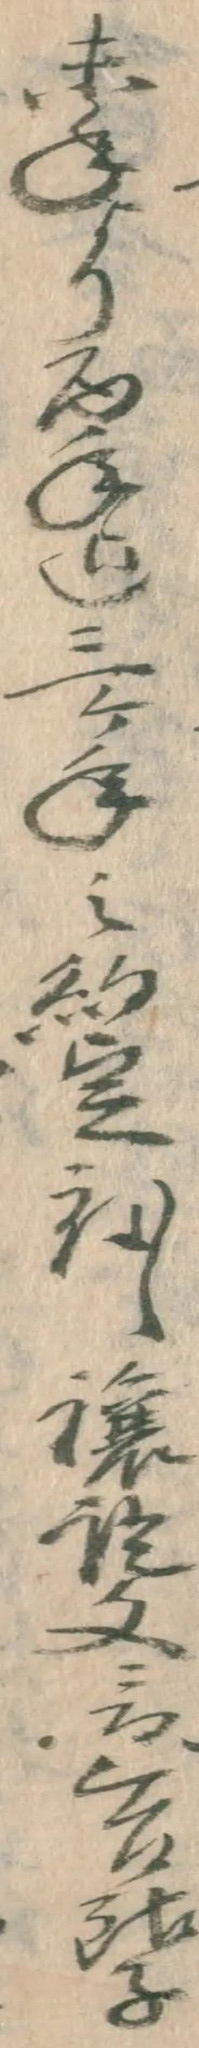未年より西年迄三ヶ年之約定致し譲證文ニ而出候銀子
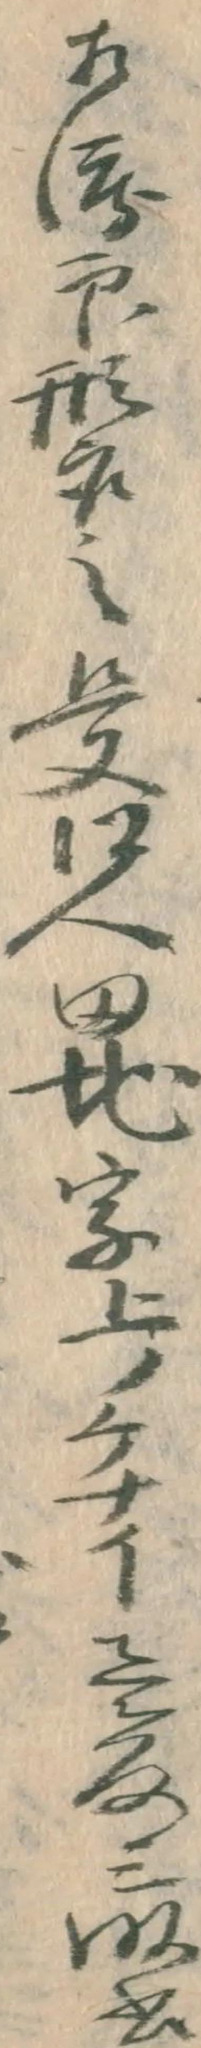相渡印形取之且又同人田地字上ノケナイ壱反三畝書
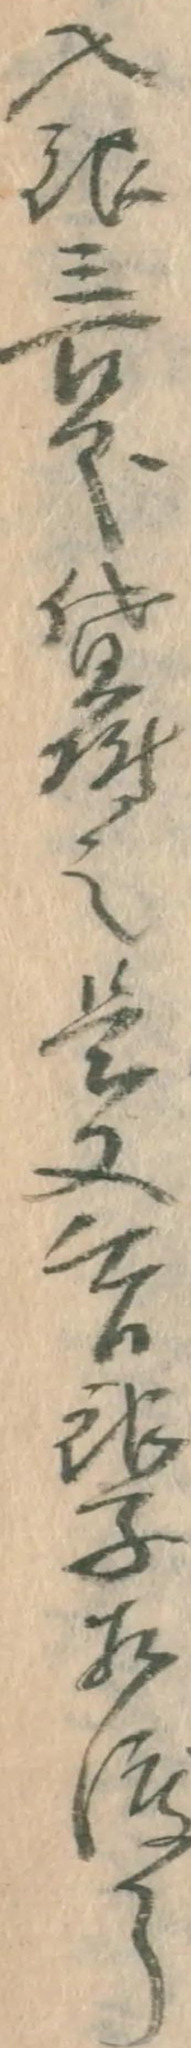入銀三百匁貸附也是又今日銀子相渡了

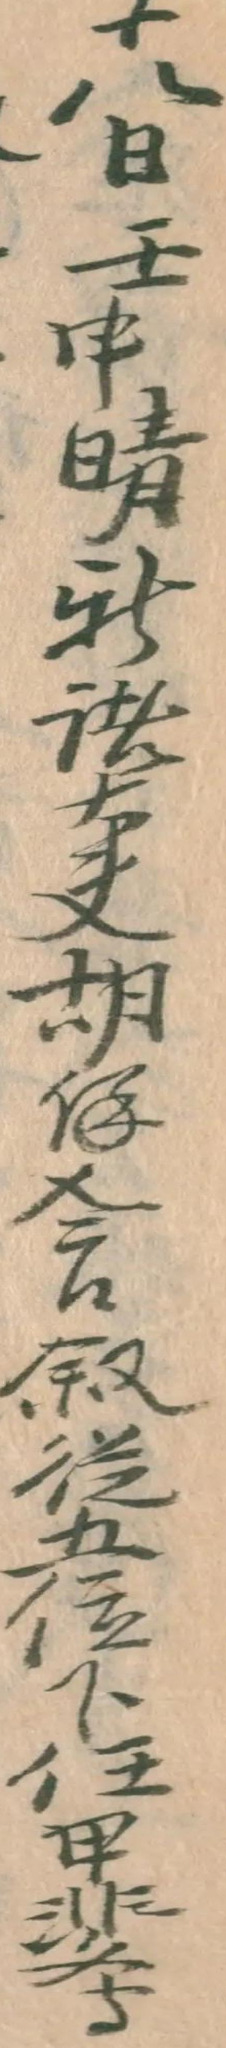十八日壬申晴新諸大夫胡保今日叙従五位下任甲斐守
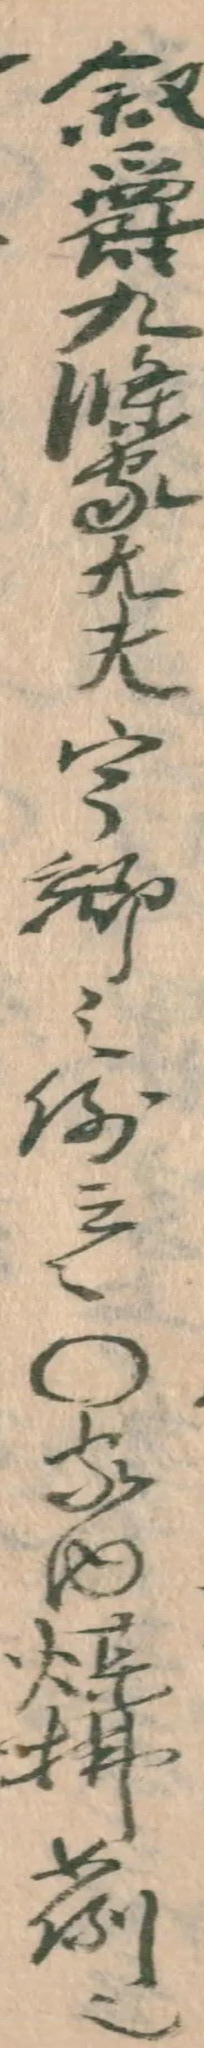叙爵九條家大夫宇郷之例云々〇家内煤払如例也
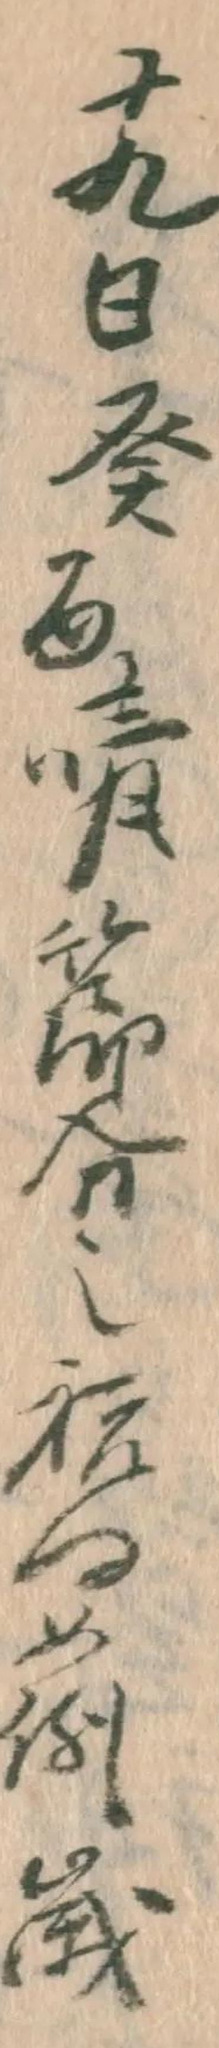十九日癸酉晴節分之祝向如例歳
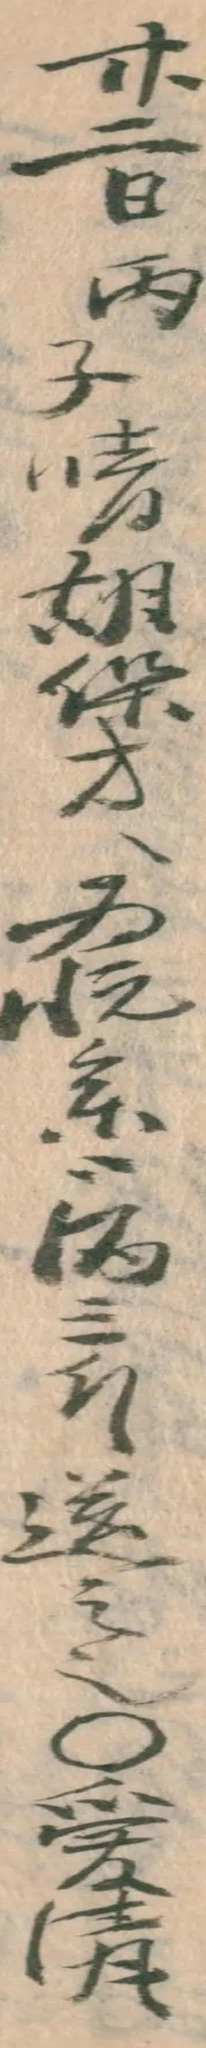廿二日丙子晴胡保方へ為祝参御酒三升送之也○愛清
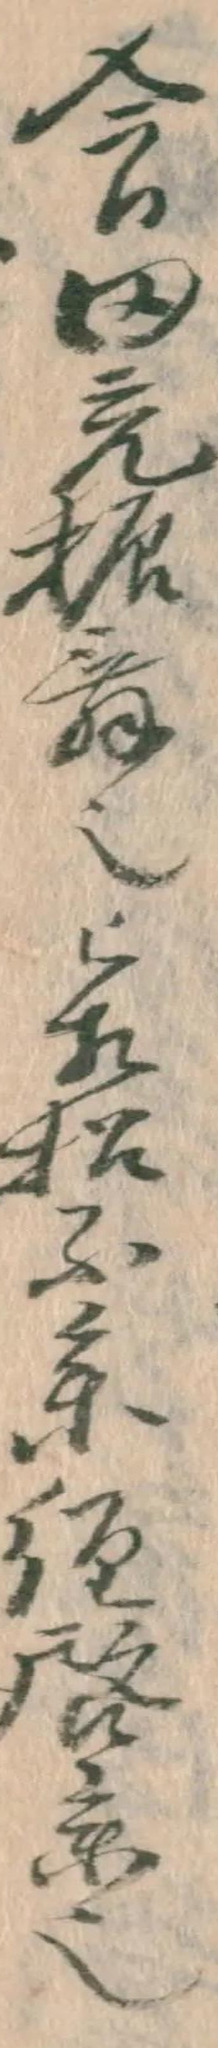今日田充振舞也被相招不参経啓参也
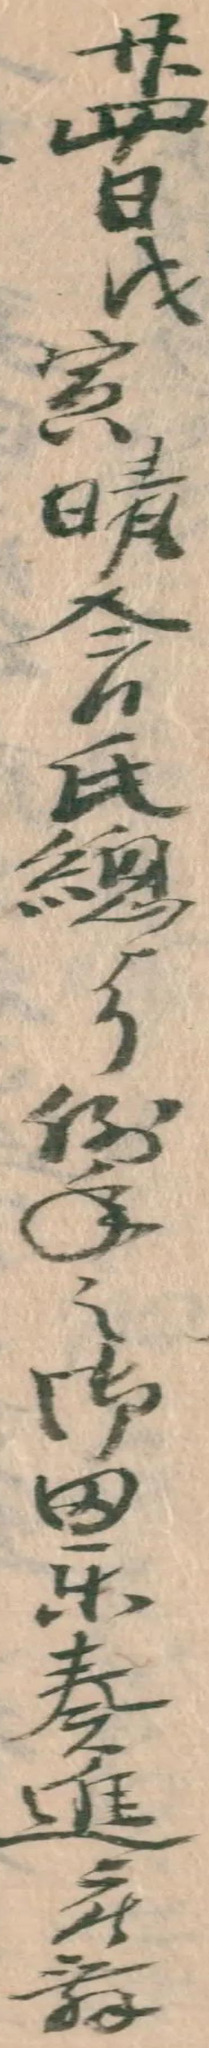廿四日戊寅晴今日氏總より例年之御田楽奏進ニ付舞
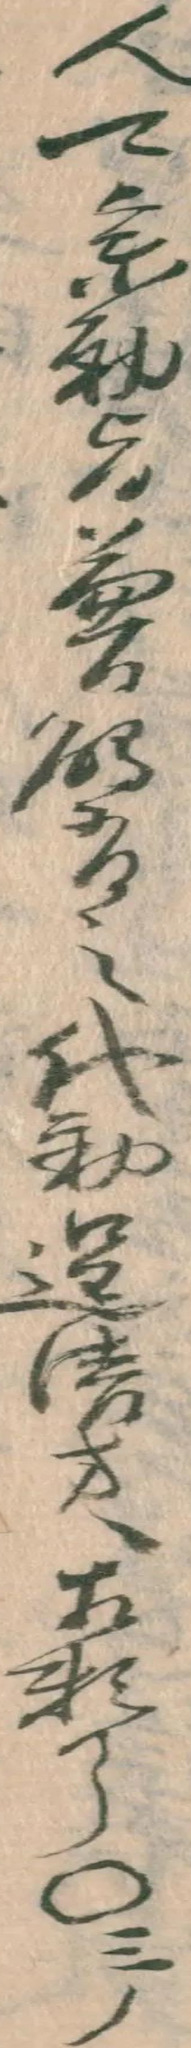人可参勤旨兼日觸有之代勤逞清方へ相頼了○三ノ
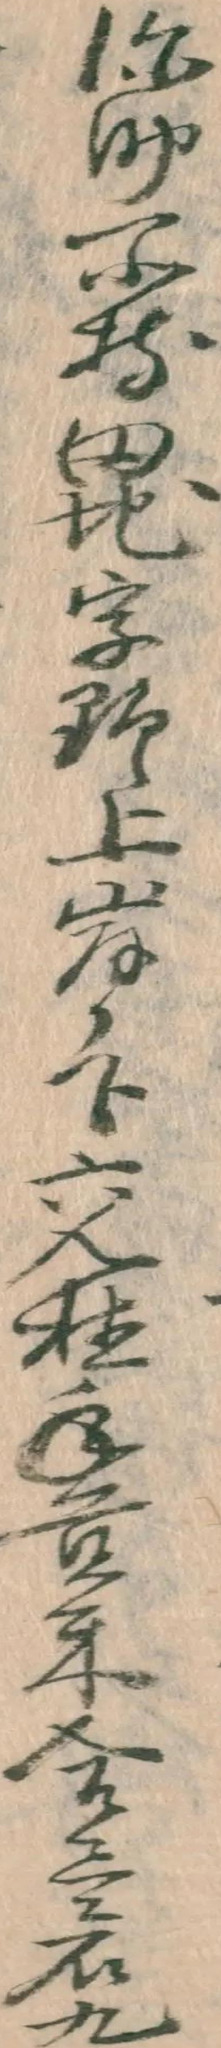弥助所持田地字野上岸ノ下六人植年貢米今日壱石九
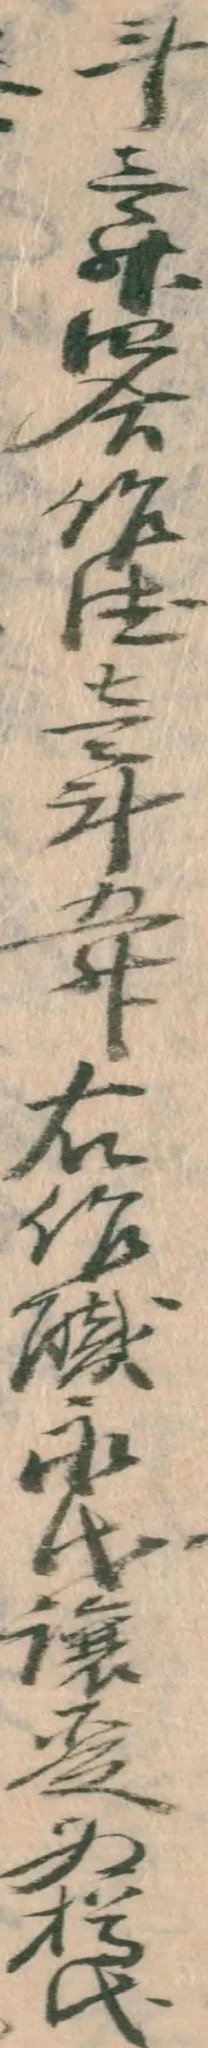斗壱升四合作徳壱斗五升右作職永代譲麦為樽代
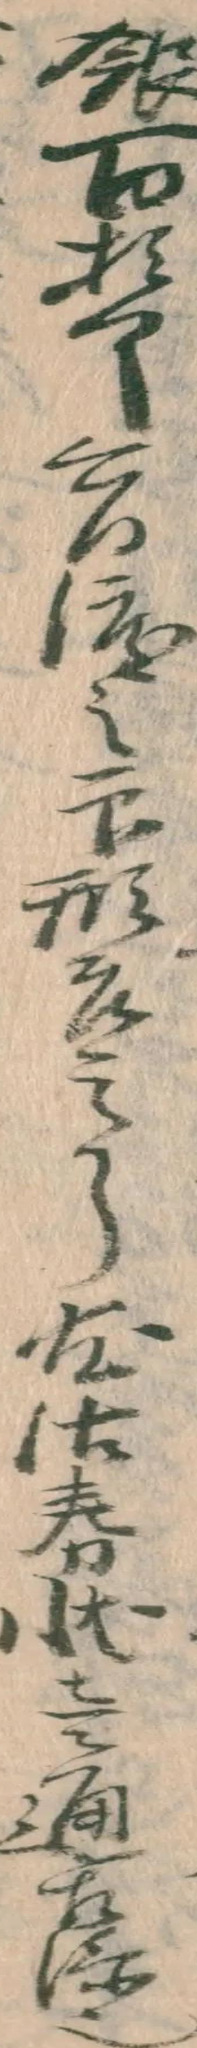銀百拾匁盲渡之印形差之了尤沽券状壱通相添也
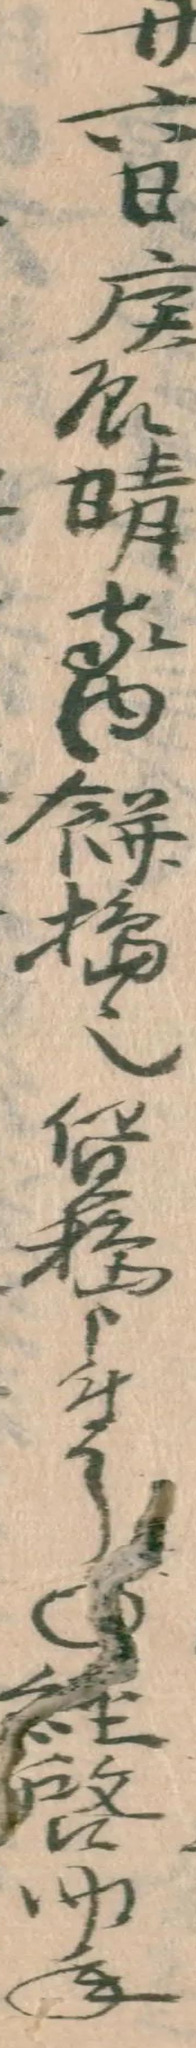廿六日庚辰晴家内餅搗也貨搗申付了○経啓明年
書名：賀茂社記録. 第67冊
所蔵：国立国会図書館 National Diet Library, JAPAN
